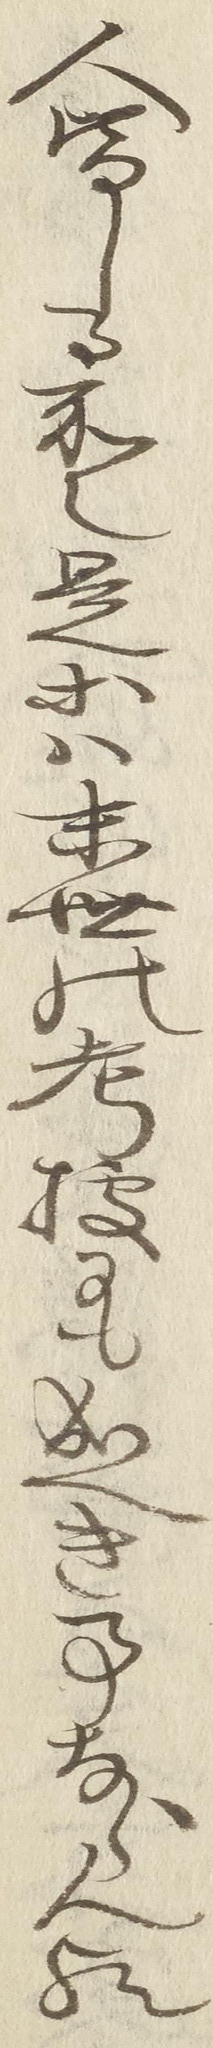人皆しる所也是等は末世の考拠にも成へき事ならん歟

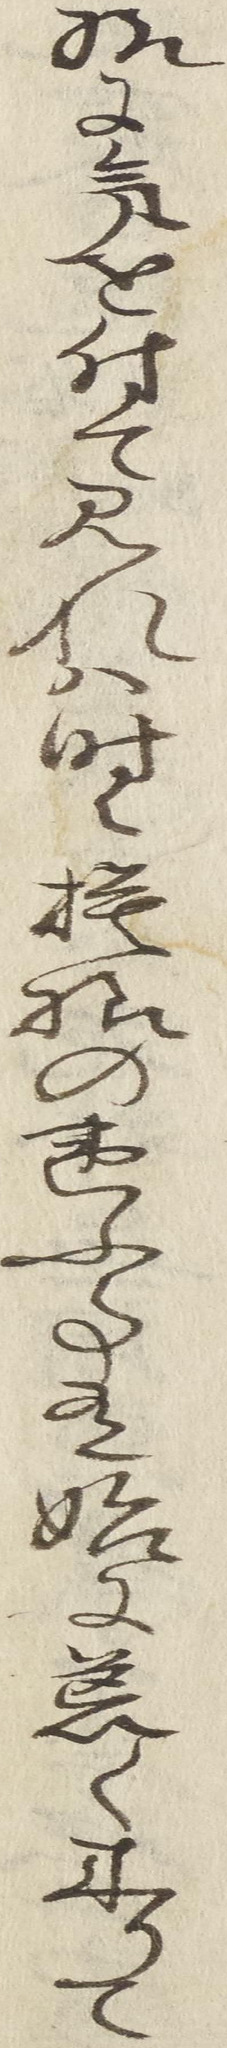様に気を付て見れは時々模様の迷ふ事有始に荒く来りて
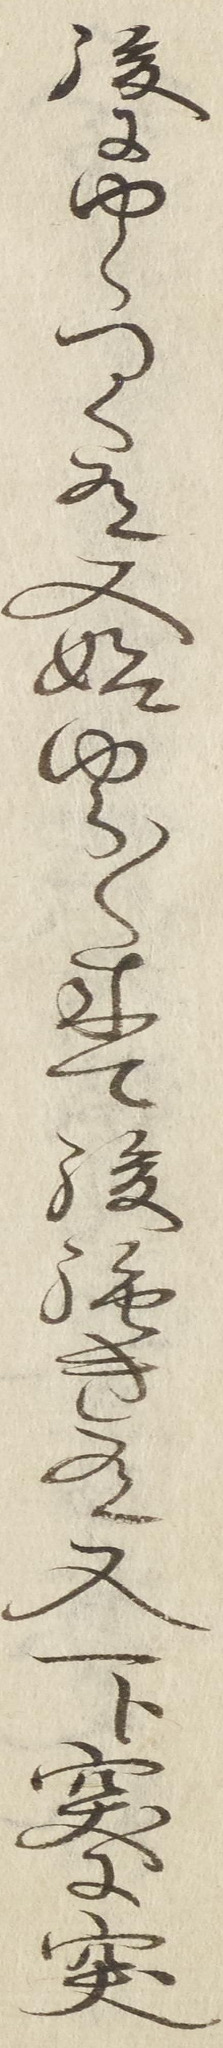後にゆらつく有又始ゆら〳〵来て後強き有又一ト突に突
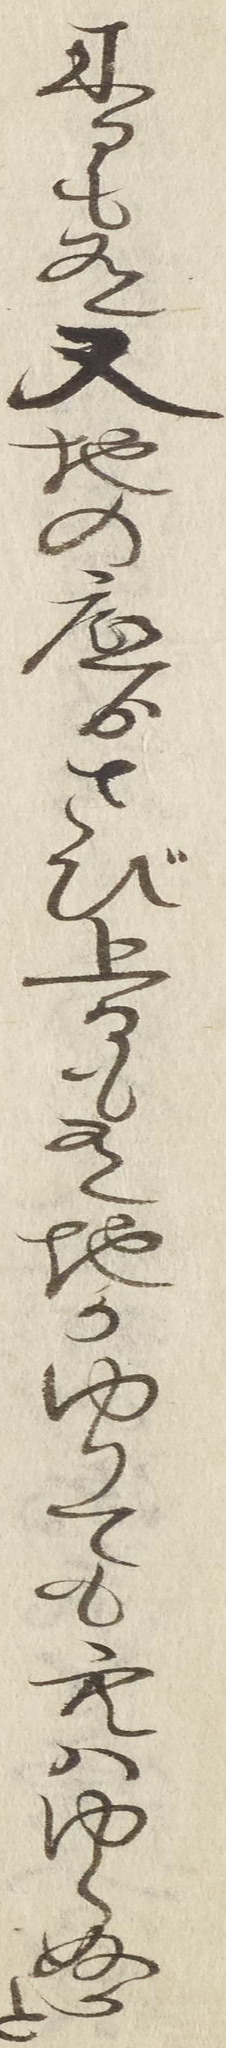来るも有又地の底ゟさび上るも有地かゆりても空はゆらぬかと
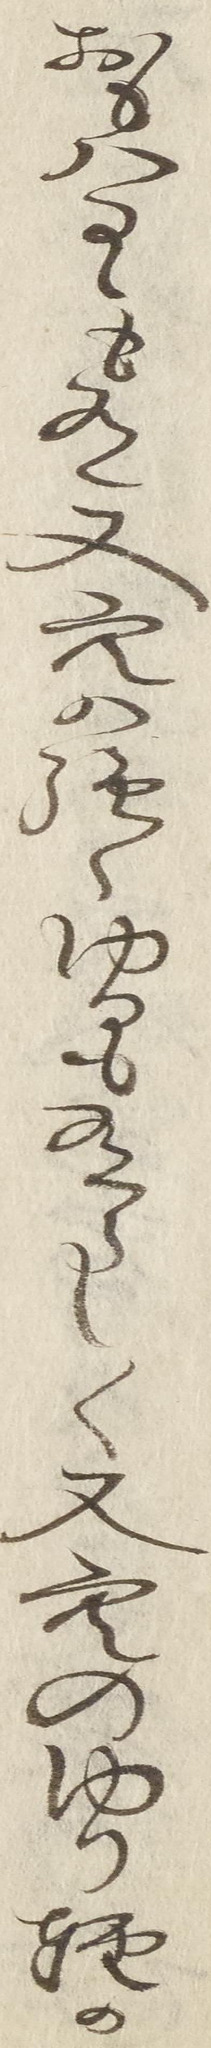おもはるゝも有又空は強くゆるも有らしく又空のゆり軽か
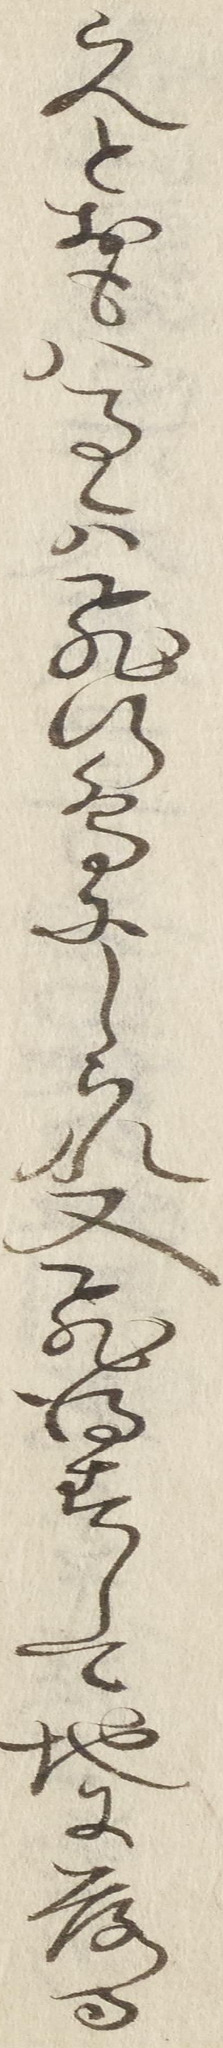らんとおもはるゝは飛行鳥にしられ又飛得すして地に落る
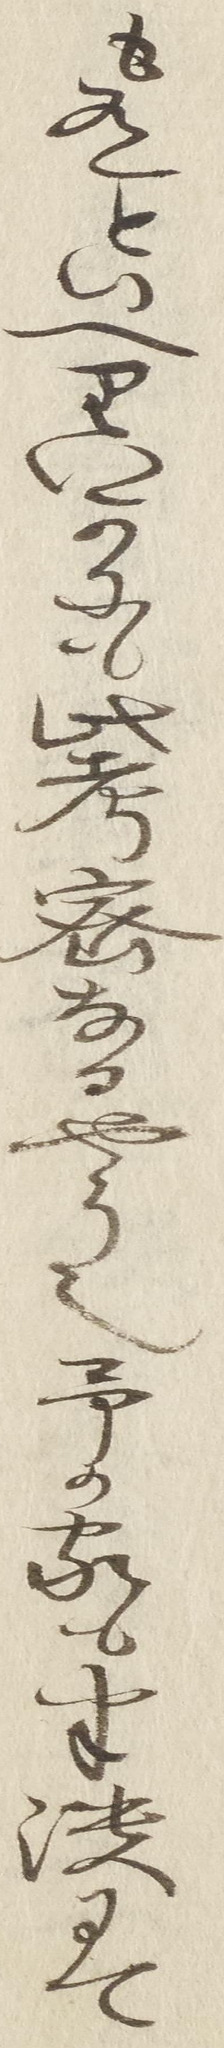も有といへりいかにも此考密なるやう也予か家も半潰にて
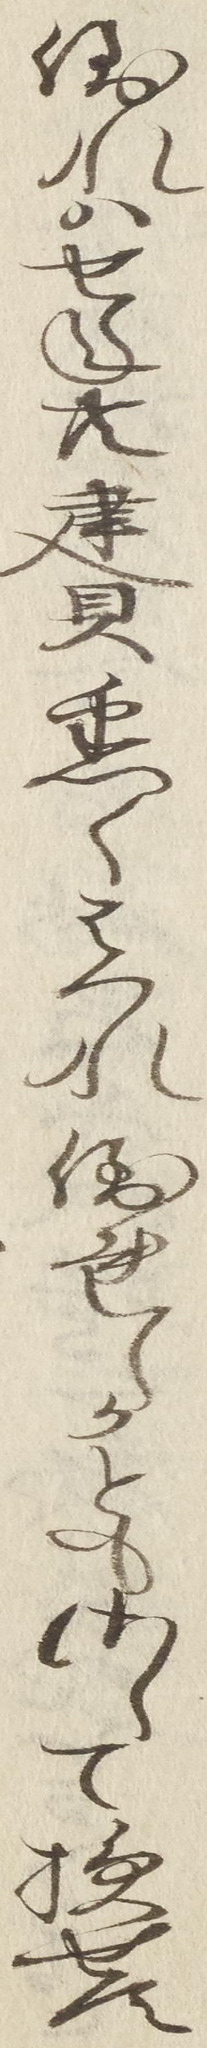倒れはせね共建具悉くはつれ倒れしかともさして損せす
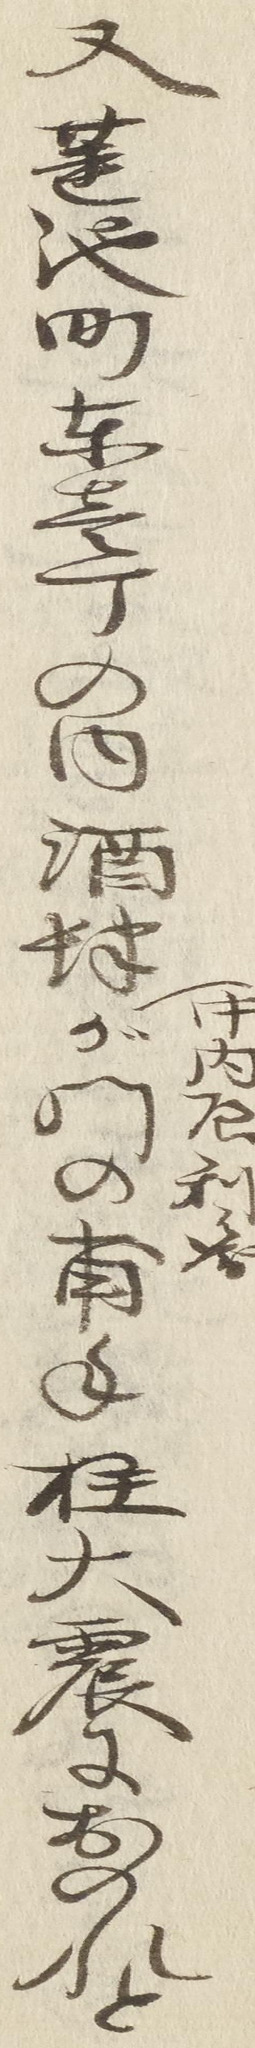又蓮池町東壱丁の内酒坪が門の甫手柱大震におのれと
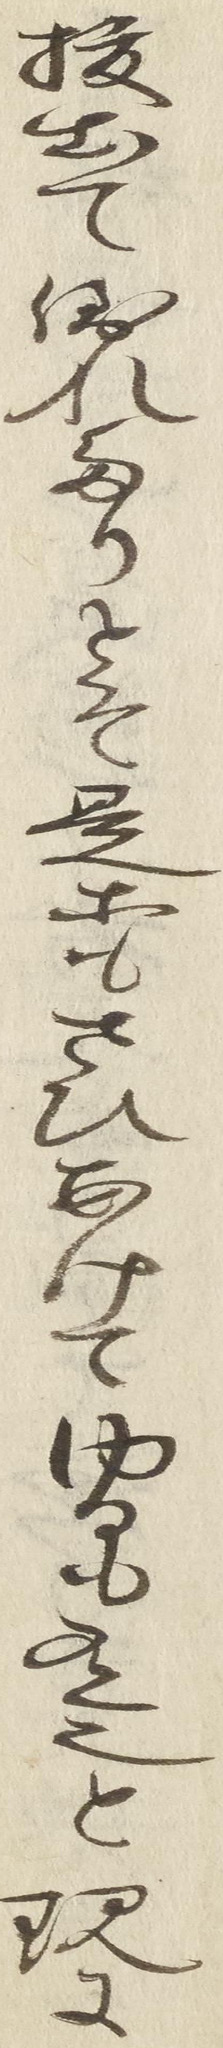抜出て倒れたりとそ是等もさひあけてゆるも有也と現に
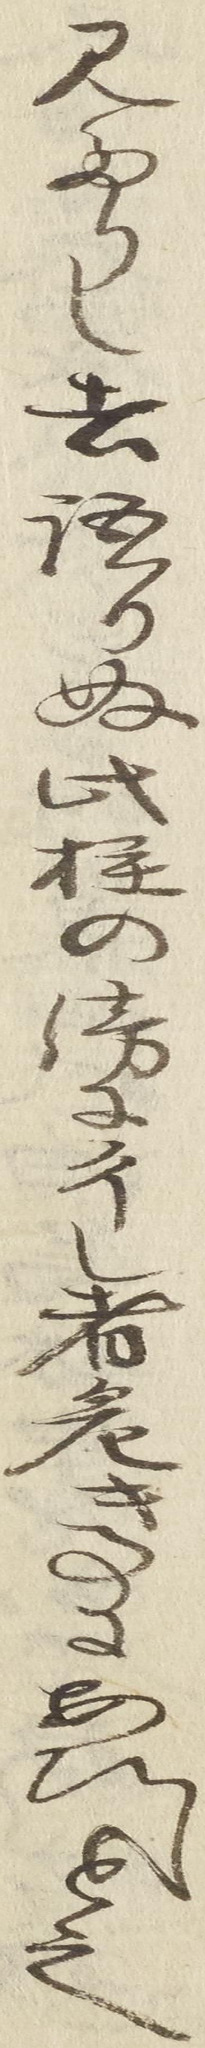見たりし者語りぬ此柱の傍に仆し者危キ事にあひしと也
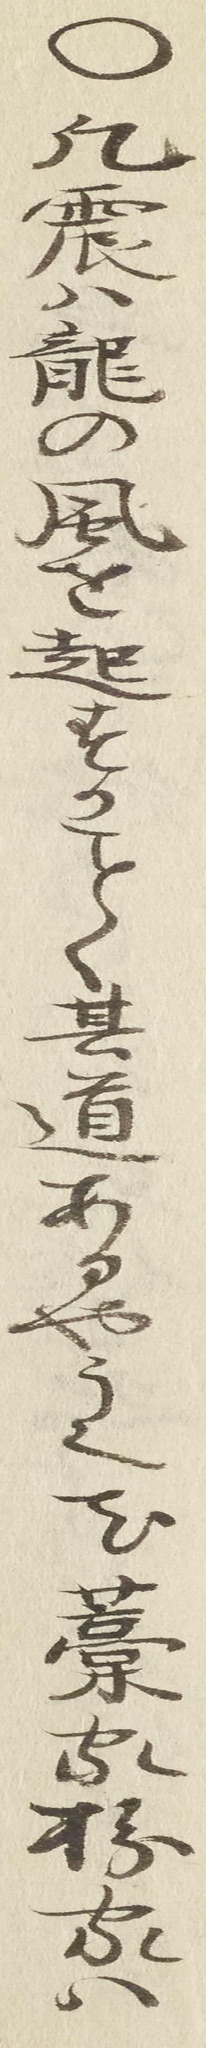○凡震は龍の風を起すかことく其道あるやう也尤藁家枌家は
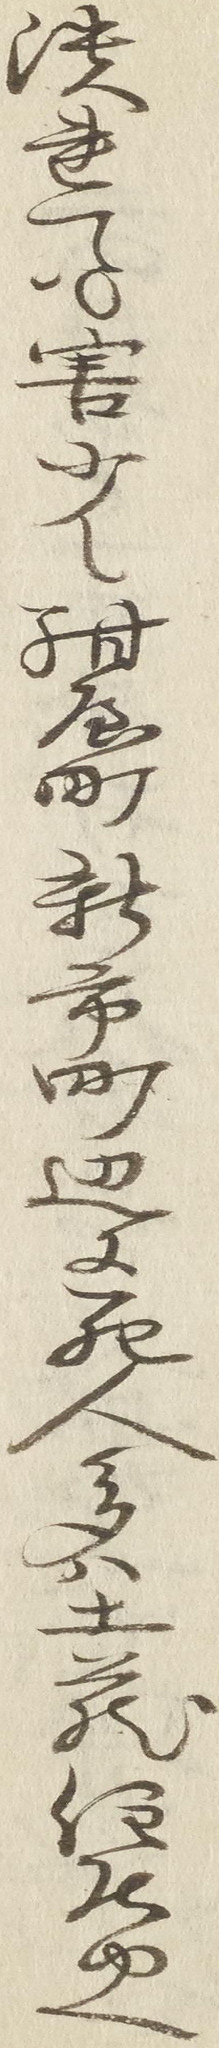潰れても害少し紺屋町新市町辺に死人多は土蔵住居ゆへ
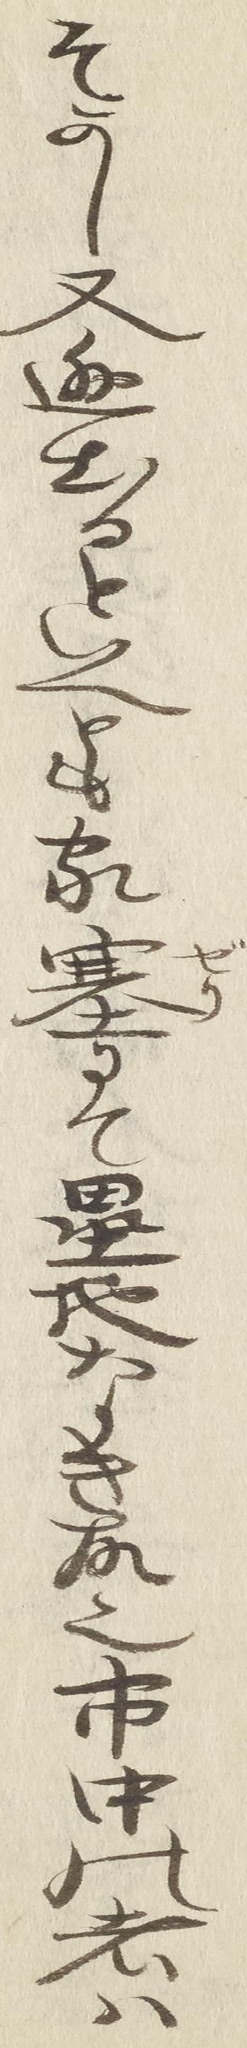そかし又逃出るといへとも家塞にて塁地なき故也市中の者は
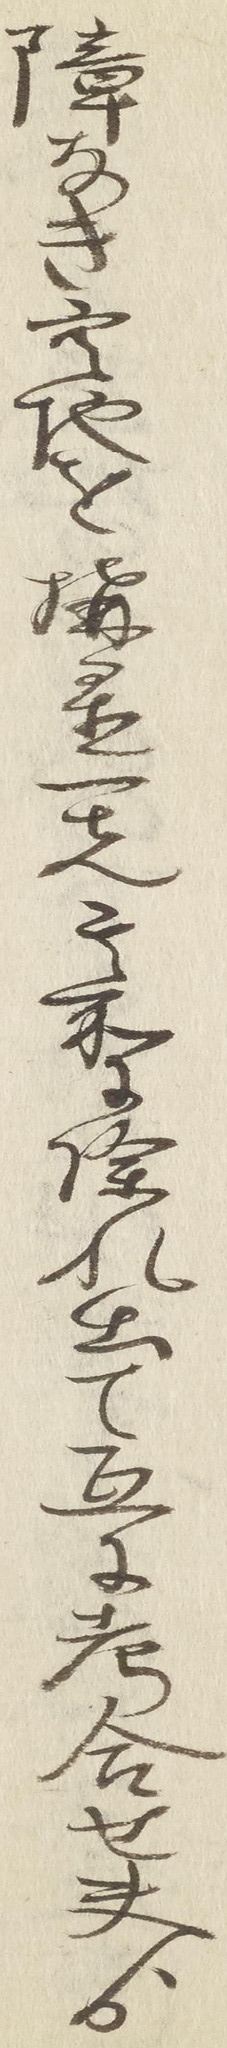障なき空地を構置一先其所に除れ出て互に考合せ夫ゟ
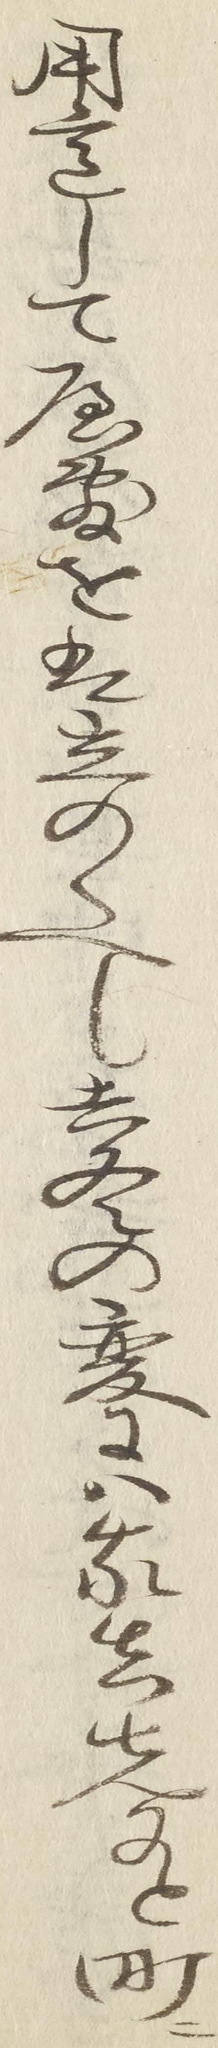用意して屋敷をは立のくへし去冬の変には家真先にと町ニ
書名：地震記　上
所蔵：東京大学地震研究所図書室 Earthquake Research Institute Library, The University of Tokyo, JAPAN
